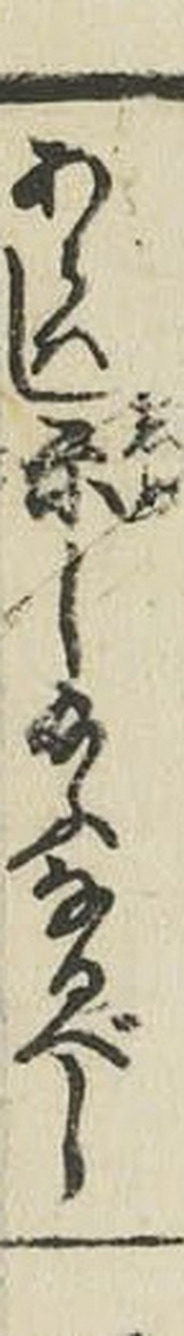あらはし示し給ふなるべし
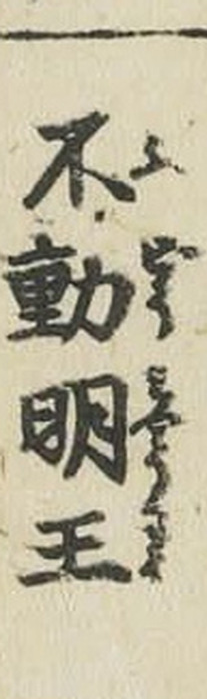不動明王
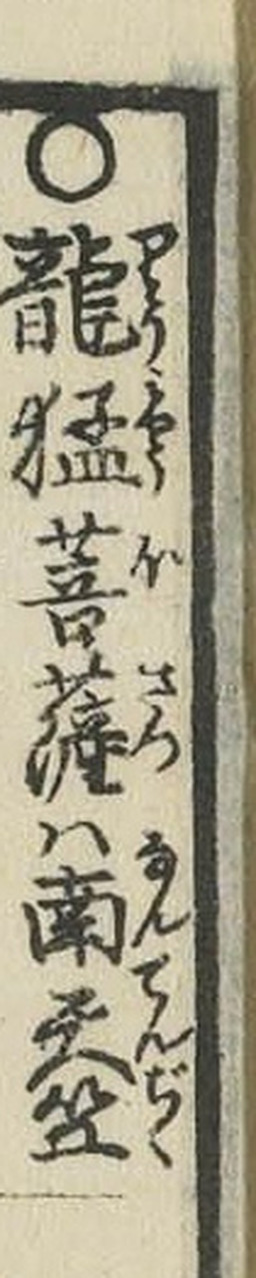○龍猛菩薩は南天竺
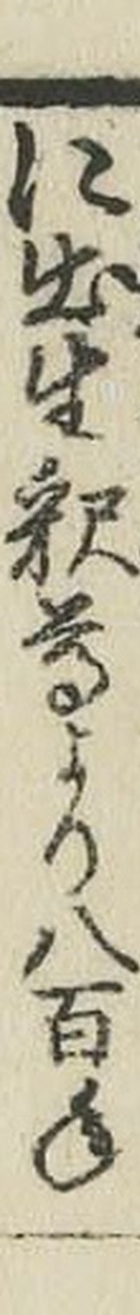に出生釈尊より八百年
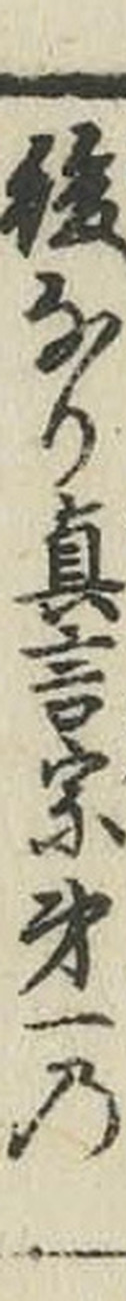後なり真言宗第一の
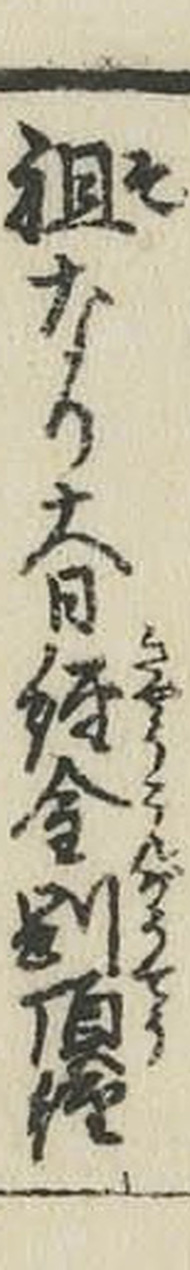祖なり大日経金剛頂経
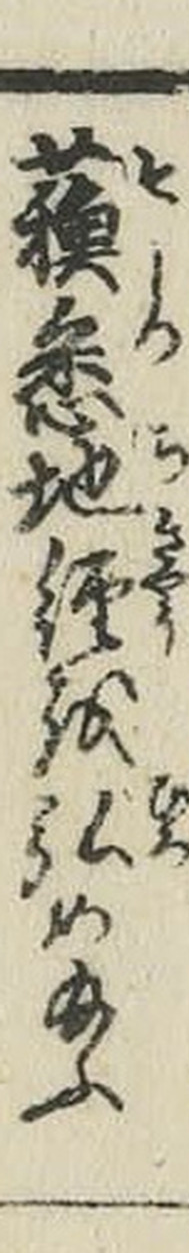蘇悉地経を弘め給ふ
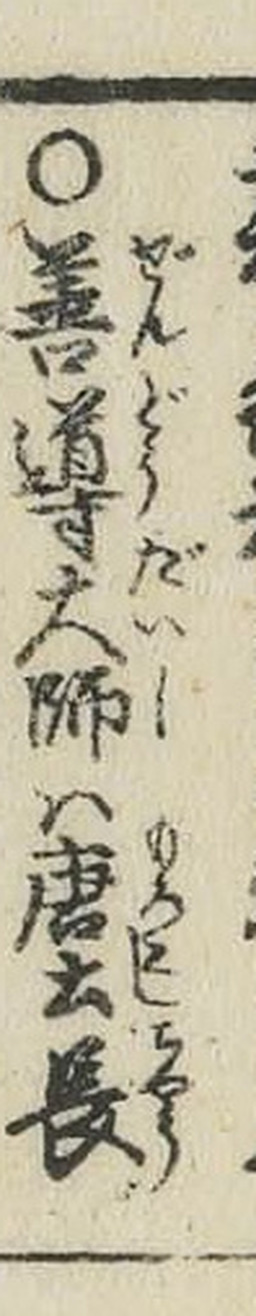○善導大師は唐土長
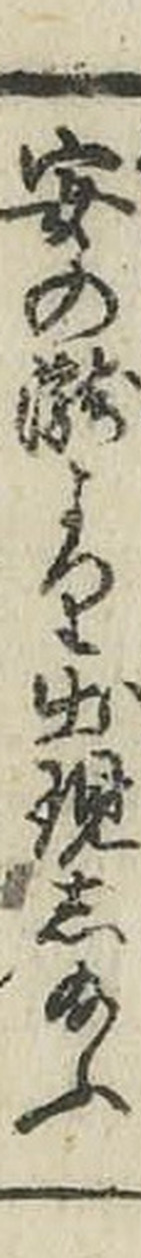安の滝より出現し給ふ
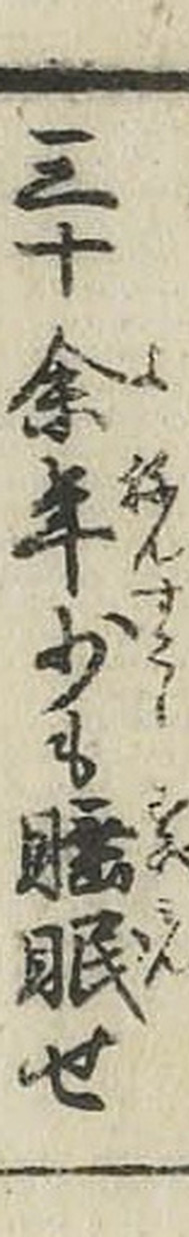三十余年少も睡眠せ
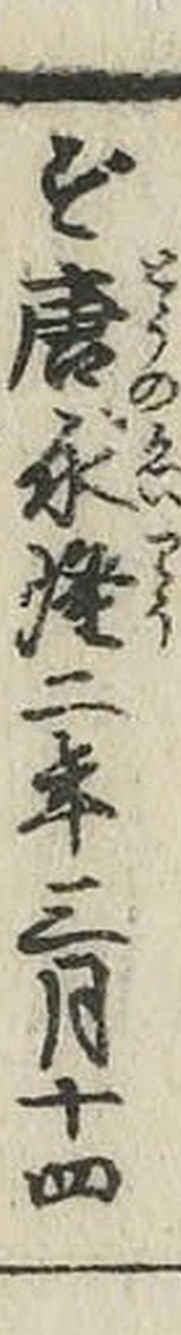ず唐永隆二年三月十四
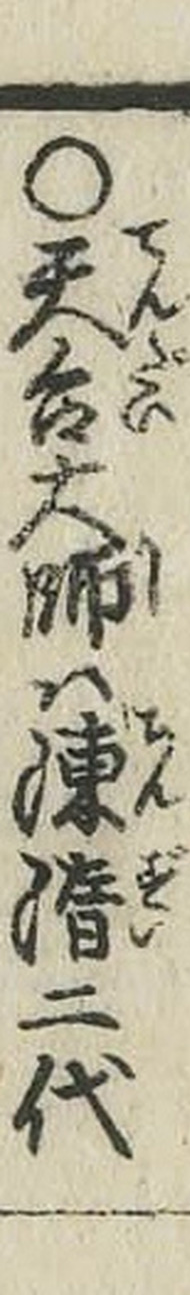○天台大師は陳隋二代
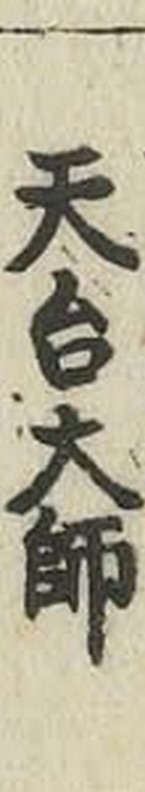天台大師
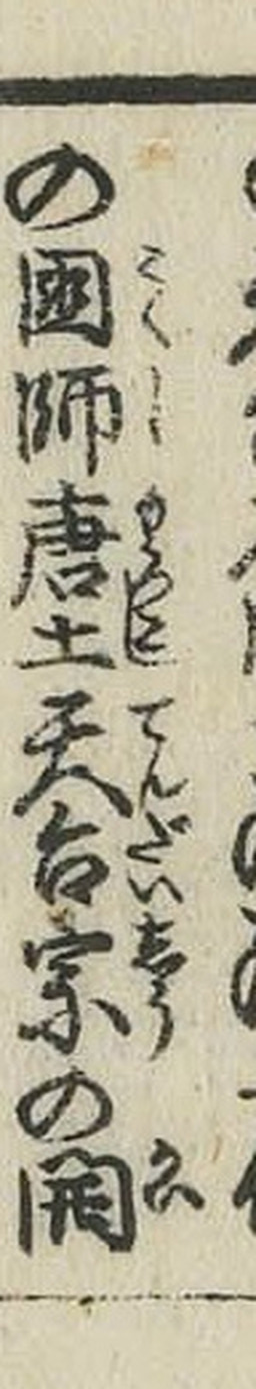の国師唐土天台宗の開
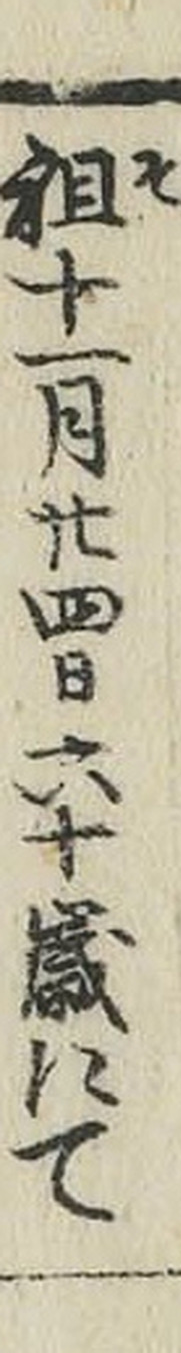祖十一月廿四日六十歳にて
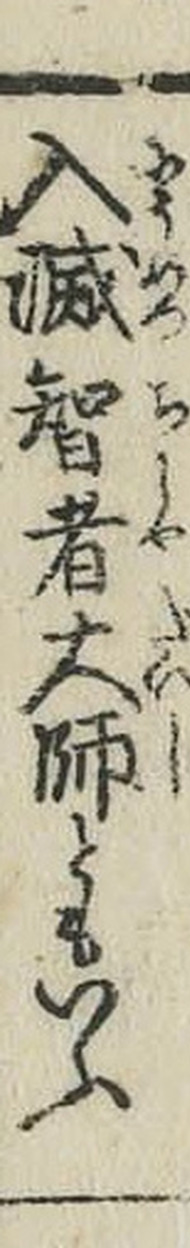入滅智者大師ともいふ
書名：増補頭書訓蒙図彙大成 10巻 10:巻之21
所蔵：東京学芸大学教育コンテンツアーカイブ
